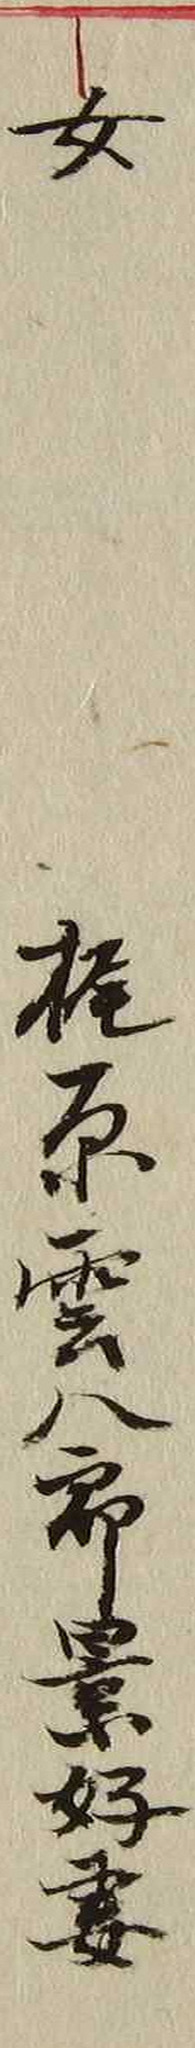女梶原雲八郎景好妻
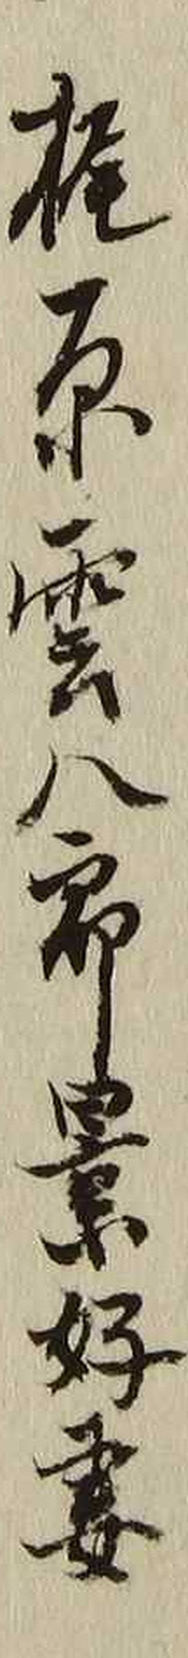女梶原雲八郎景好妻
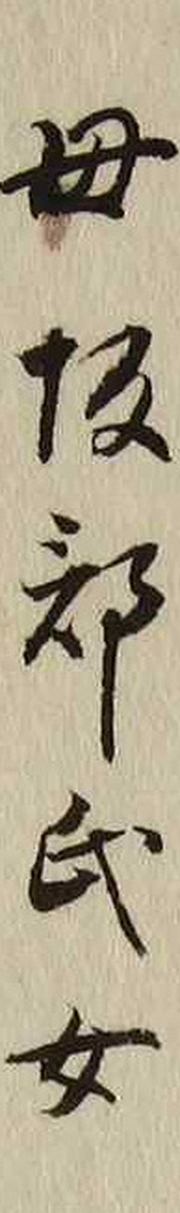母坂部氏女
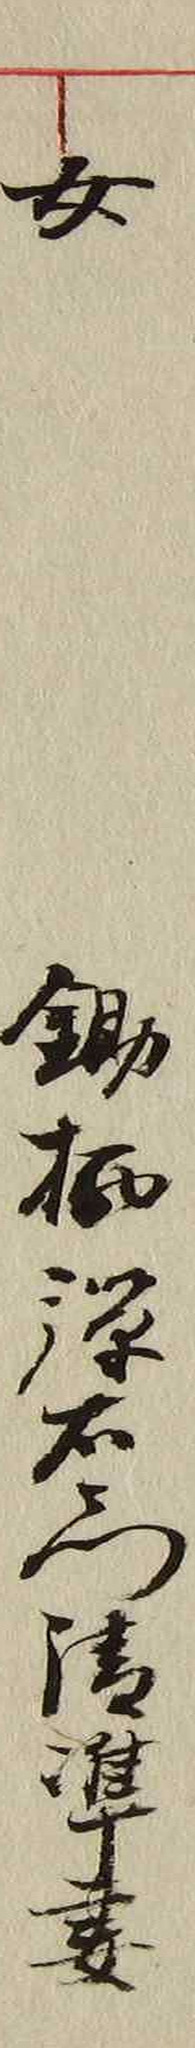女鋤栖騨右衛門清準肆妻
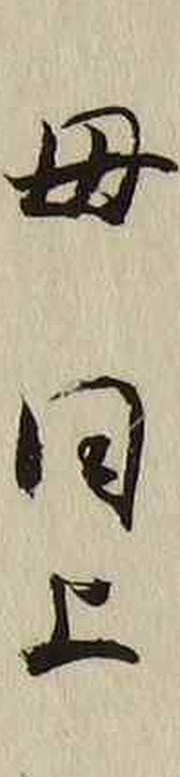母同上
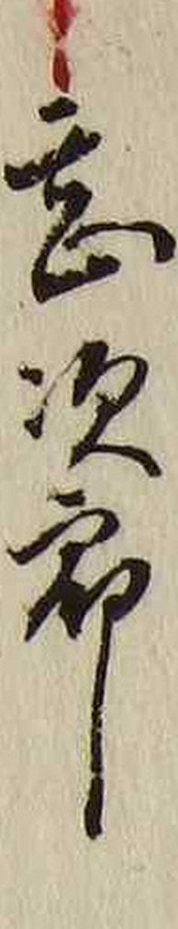甚次郎
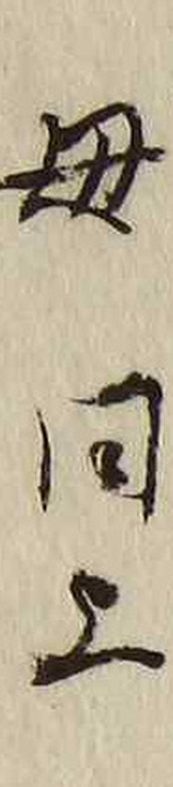母同上

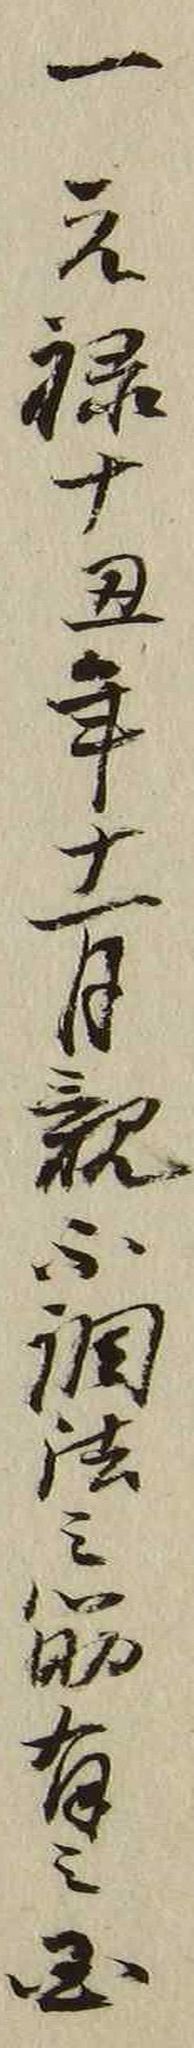一元禄十丑年十一月親不調法之筋有之国
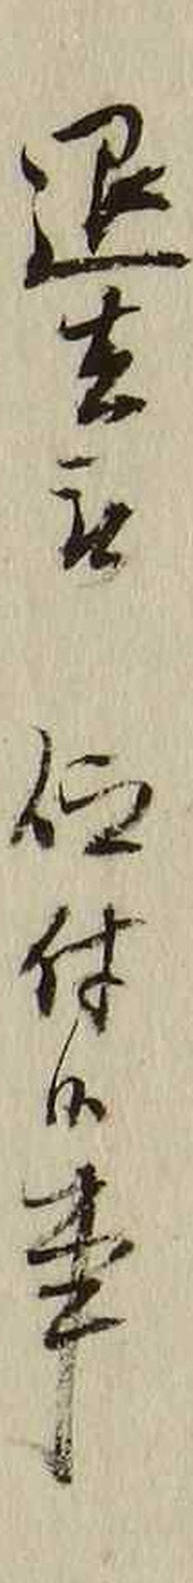退去被仰付候事
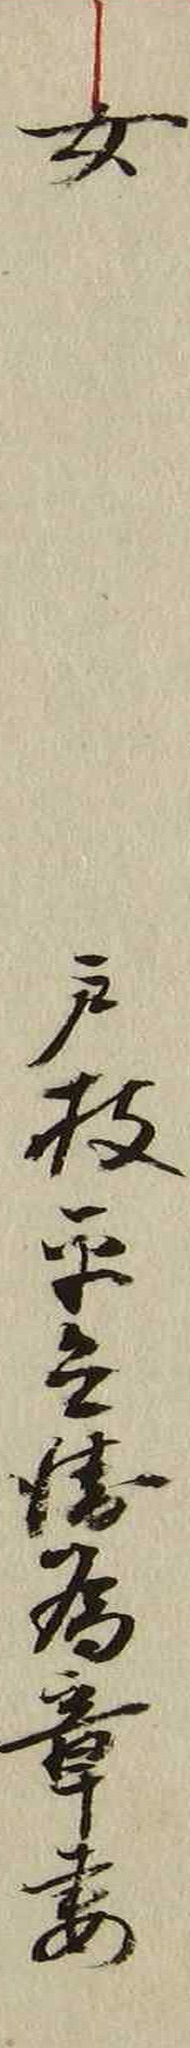女戸枝平兵衛為章妻
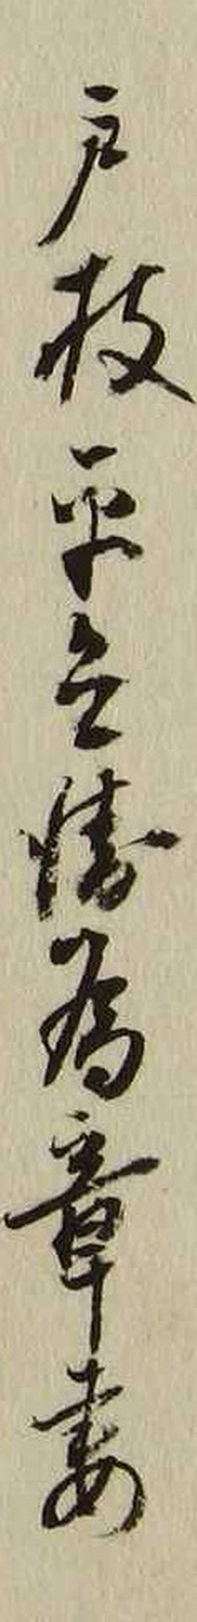女戸枝平兵衛為章妻
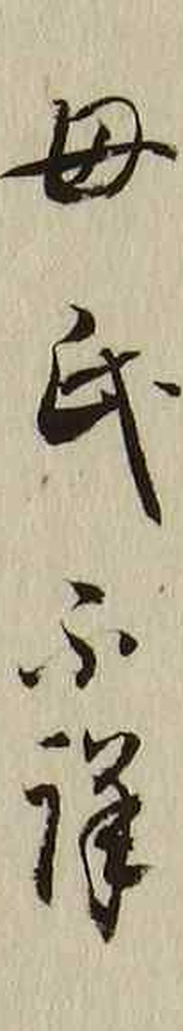母氏不詳
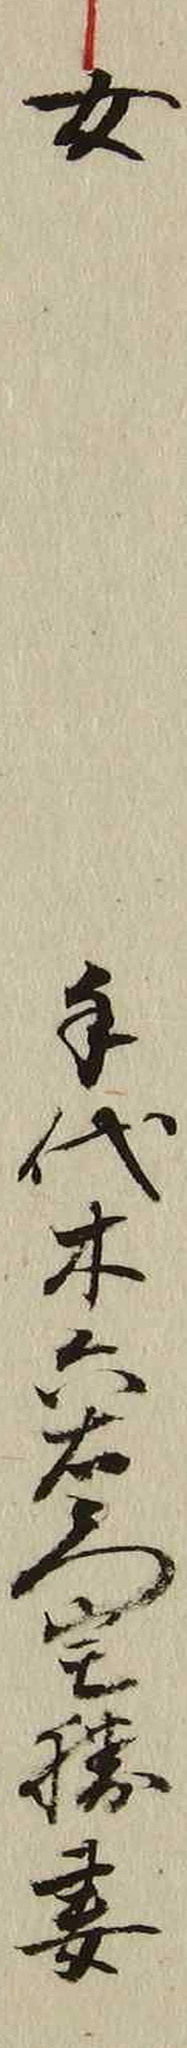女手代木六右衛門宅勝妻
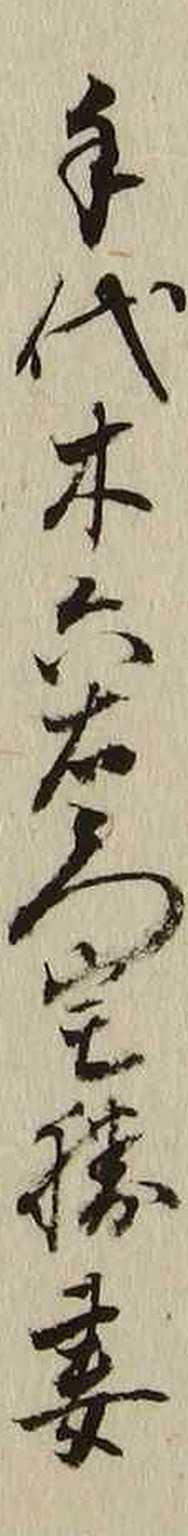女手代木六右衛門宅勝妻
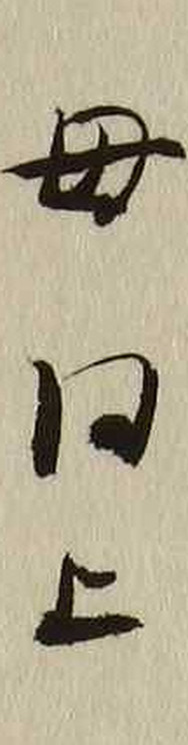母同上
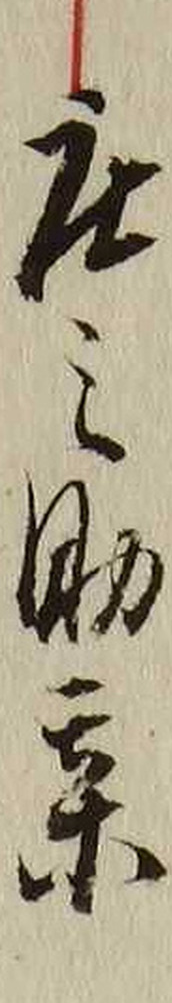庄之助某
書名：諸士系譜　巻之349　も之部5
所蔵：会津若松市立会津図書館
